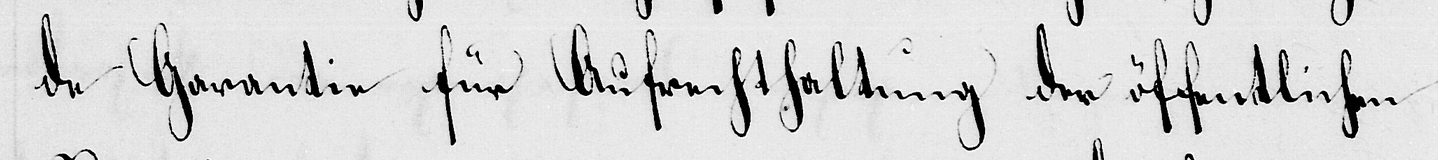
de Garantie für Aufrechthaltung der öffentlichen
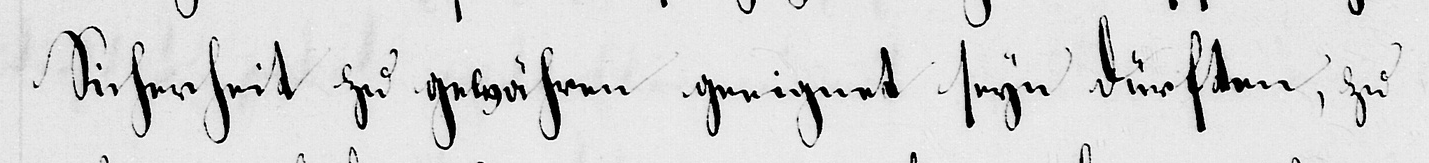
Sicherheit zu gewähren geeignet seyn dürften, zu
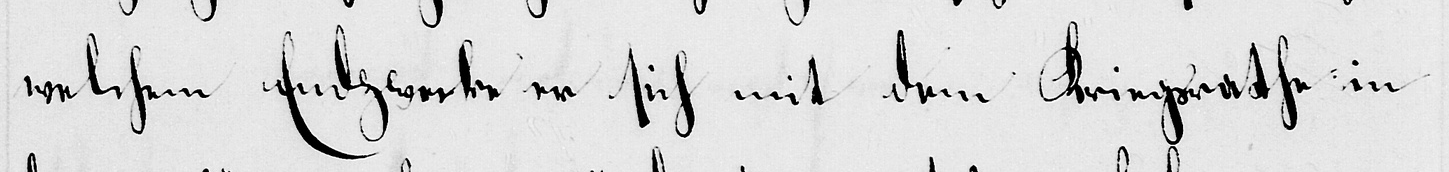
welchem Endzwecke er sich mit dem Kriegsrathe in
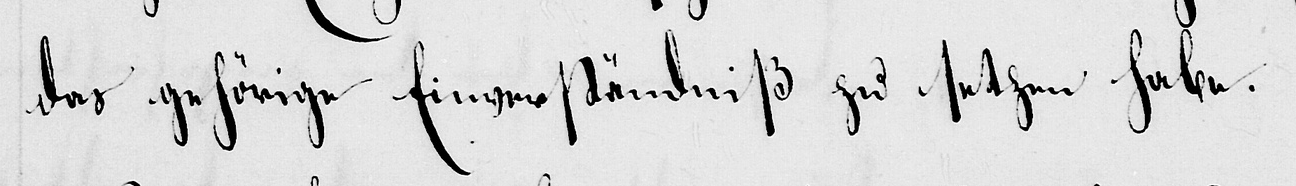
das gehörige Einverständniß zu setzen habe.
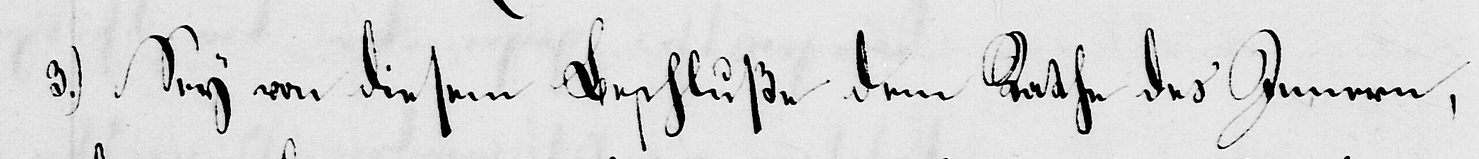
3.) Sey von diesem Beschluße dem Rathe des Innern,
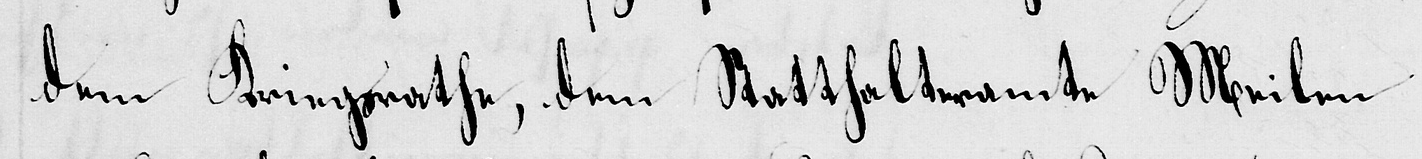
dem Kriegsrathe, dem Statthalteramte Meilen
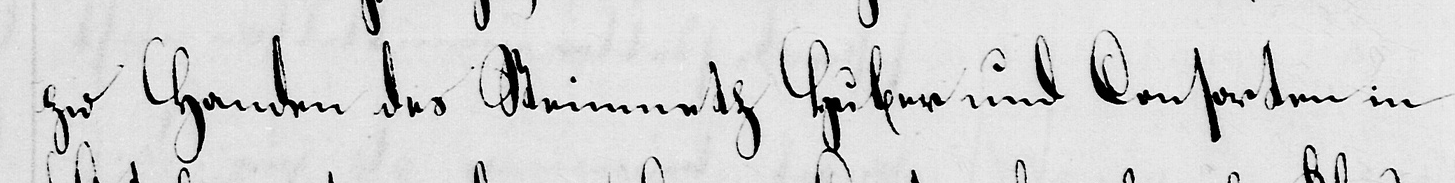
zu Handen des Steinmetz Huber und Consorten in
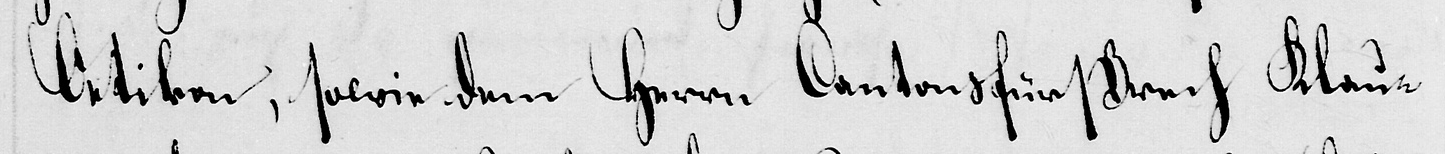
Oetikon, sowie dem Herrn Cantonsfürsprech Klau¬
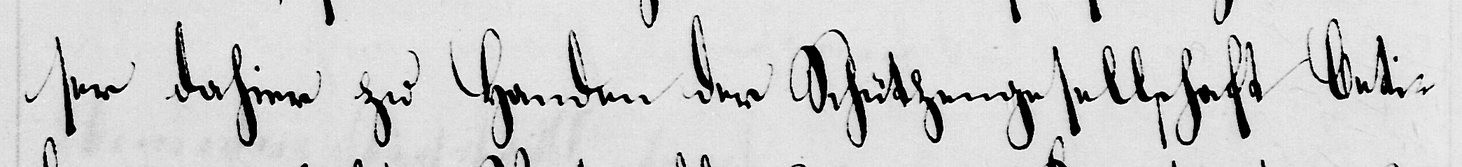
ser dahier zu Handen der Schützengesellschaft Oeti¬
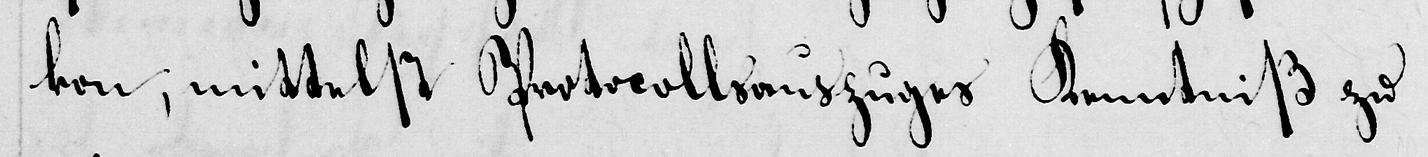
kon, mittelst Protocollsauszuges Kenntniß zu
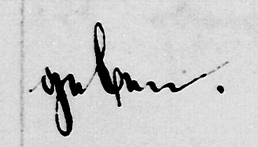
geben.
